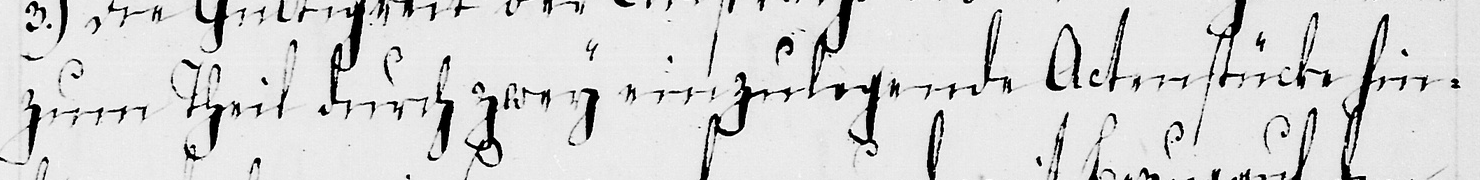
zum Theil durch zwey einzulegende Actenstücke hin¬
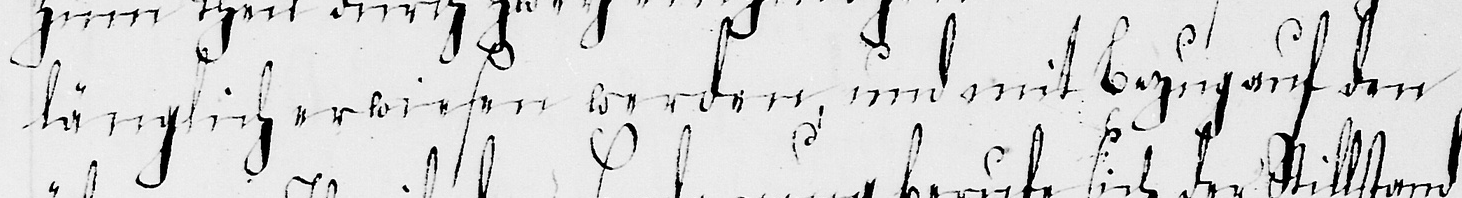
länglich erwiesen werden, und mit Bezug auf den
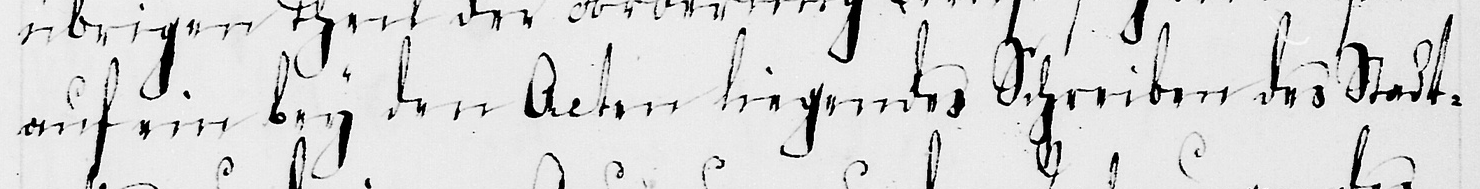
auf ein bey den Acten liegendes Schreiben des Stadt¬
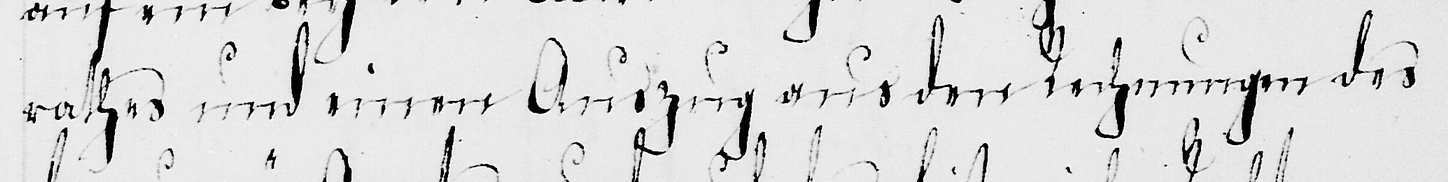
rathes und einen Auszug aus den Rechnungen des
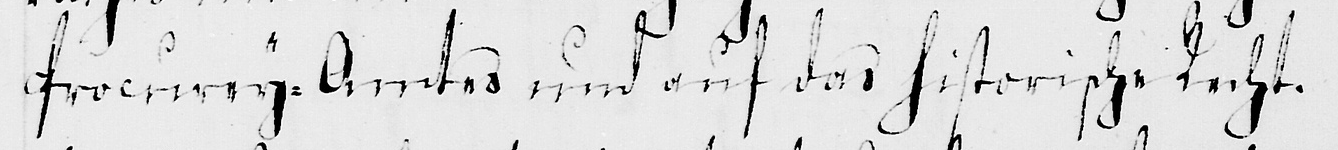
Procurey-Amtes und auf das historische Recht.
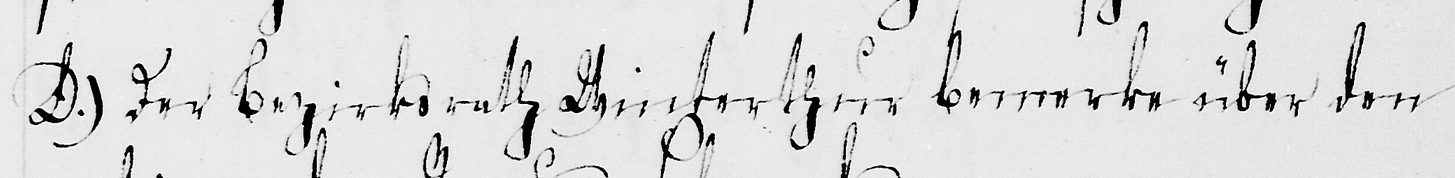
D.) Der Bezirksrath Winterthur bemerke über den
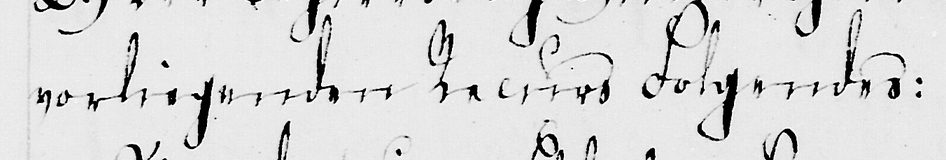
vorliegenden Recurs Folgendes:
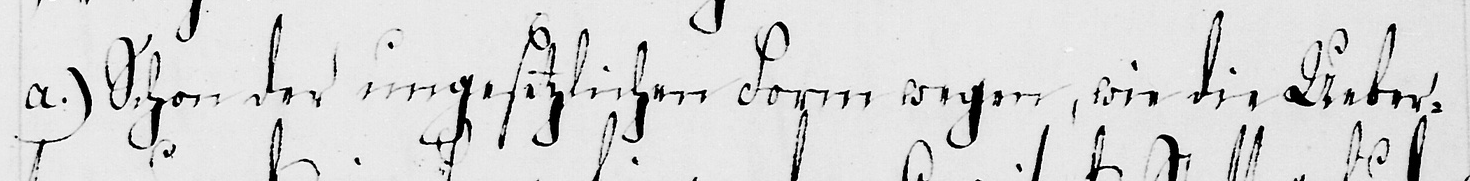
a.)Schon der ungesetzlichen Form wegen, wie die Ueber¬
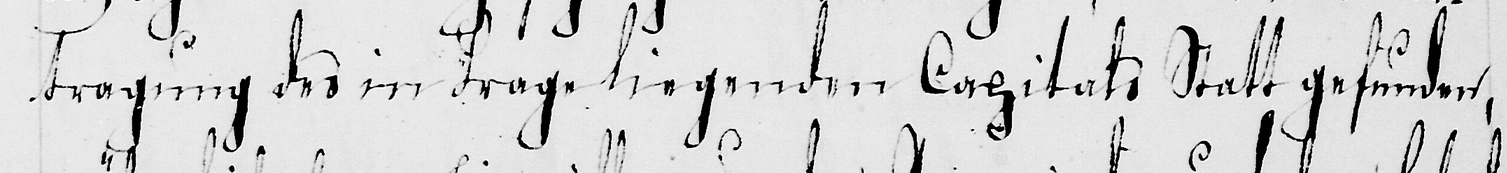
tragung des in Frage liegenden Capitals Statt gefunden,
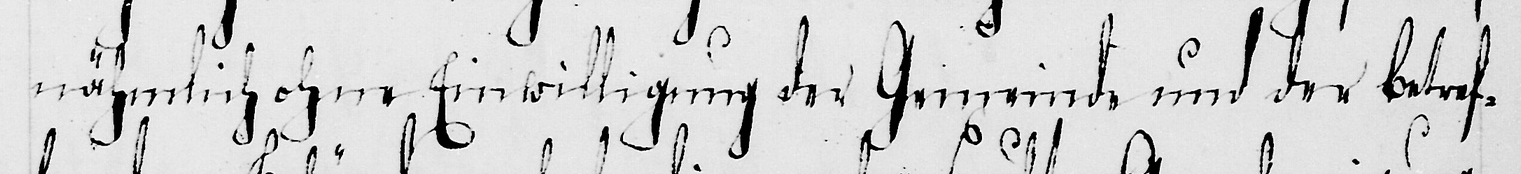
nähmlich ohne Einwilligung der Gemeinde und der betref¬
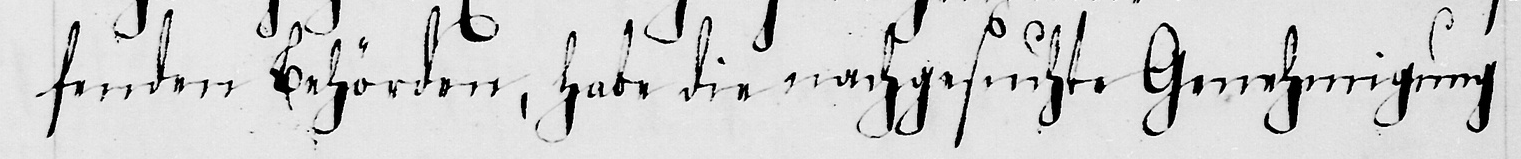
fenden Behörden, habe die nachgesuchte Genehmigung
